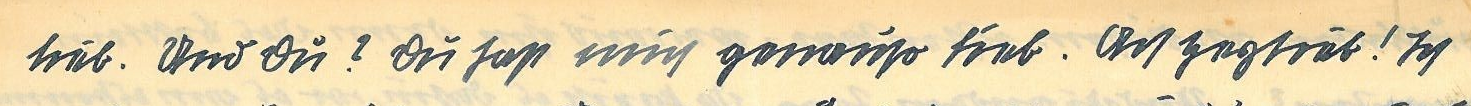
lieb und Du? Du hast mich genauso lieb. Ach Herzlieb! Ich
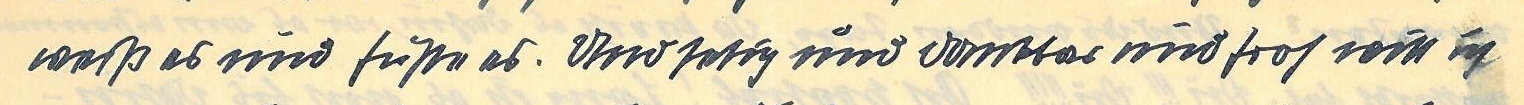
weiß es und fühle es. Und selig und dankbar und froh will ich
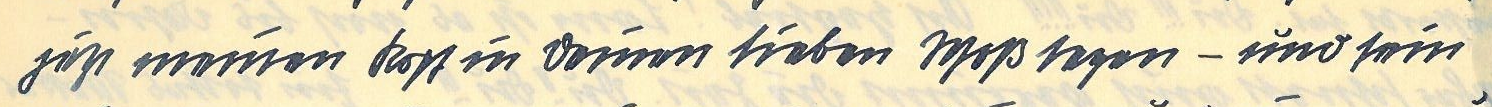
jetzt meinen Kopf in Deinen lieben Schoß legen – und sein
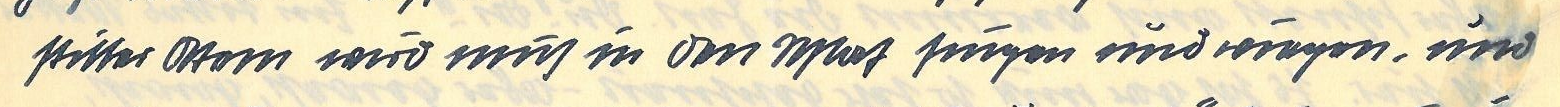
stiller Atem wird mich in den Schlaf singen und wiegen, und
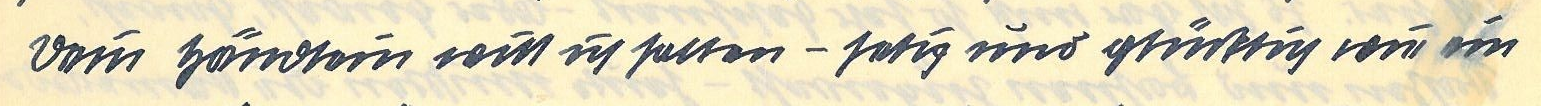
Dein Händlein will ich halten – selig und glücklich wie ein
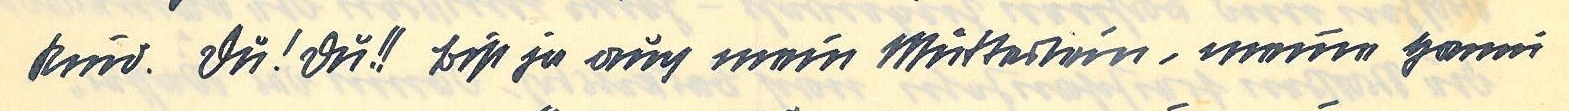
Kind. Du! Du!! Bist ja auch mein Mütterlein – meine
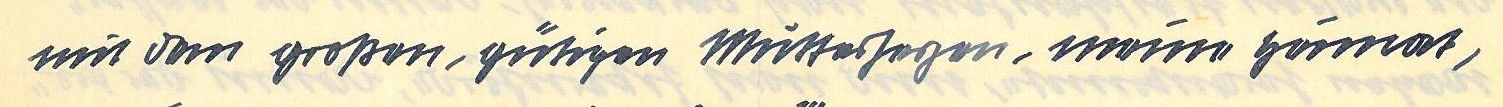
mit dem großen, gütigen Mutterherzen, meine Heimat,
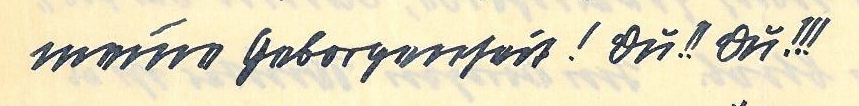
meine Geborgenheit! Du!! Du!!!
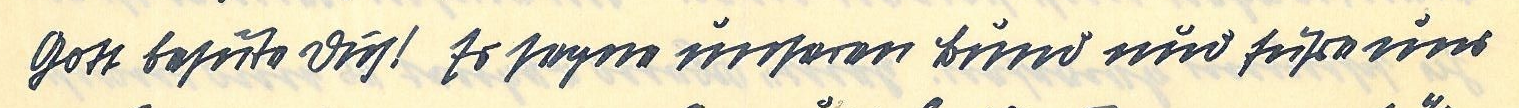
Gott behüte Dich! Er segne unseren Bund und führe uns
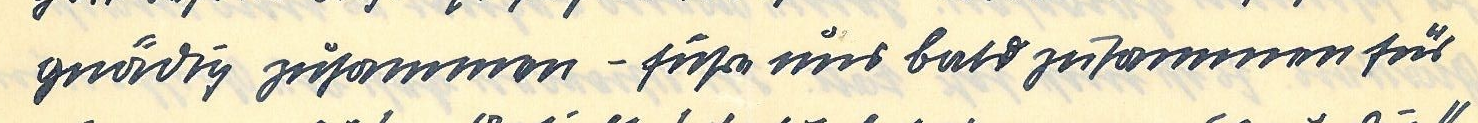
gnädig zusammen – führe uns bald zusammen für
